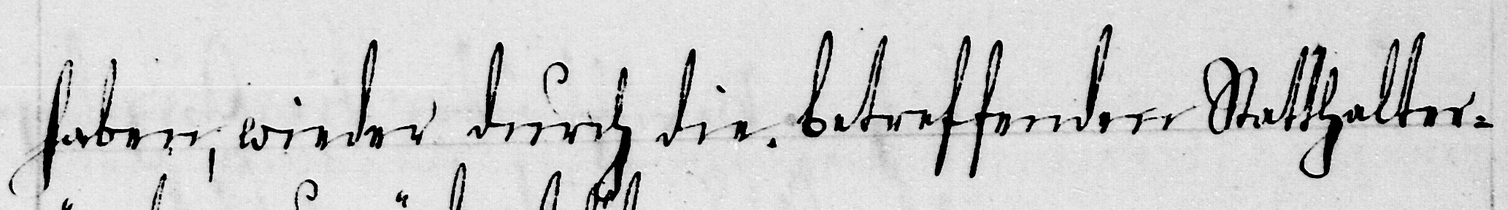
haben, wieder durch die betreffenden Statthalter¬
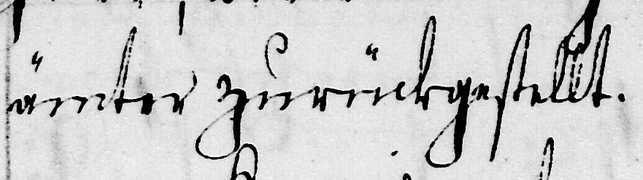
ämter zurückgestellt.
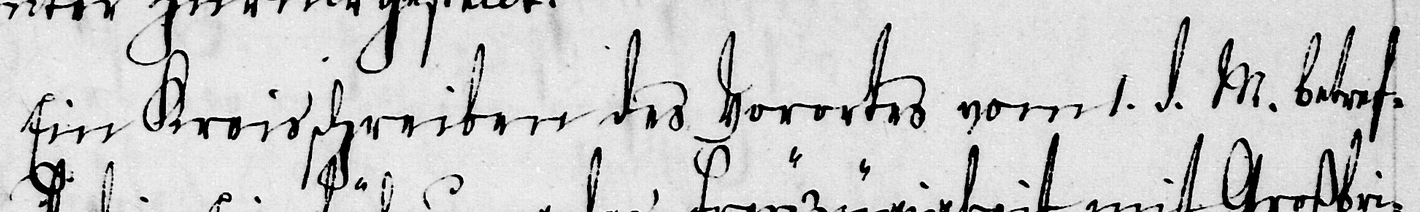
Ein Kreisschreiben des Vorortes vom 1. d. M. betref¬
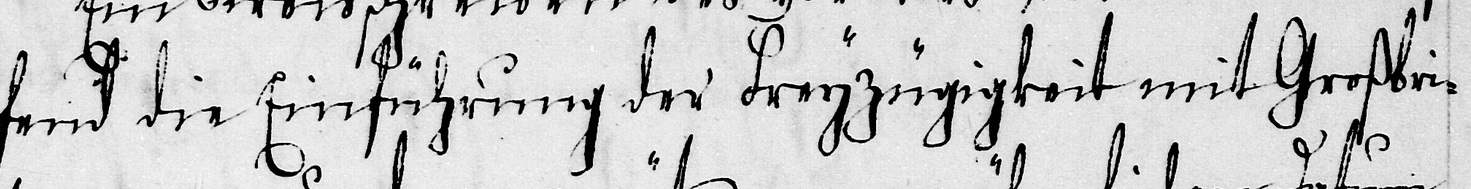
fend die Einführung der Freyzügigkeit mit Großbri¬
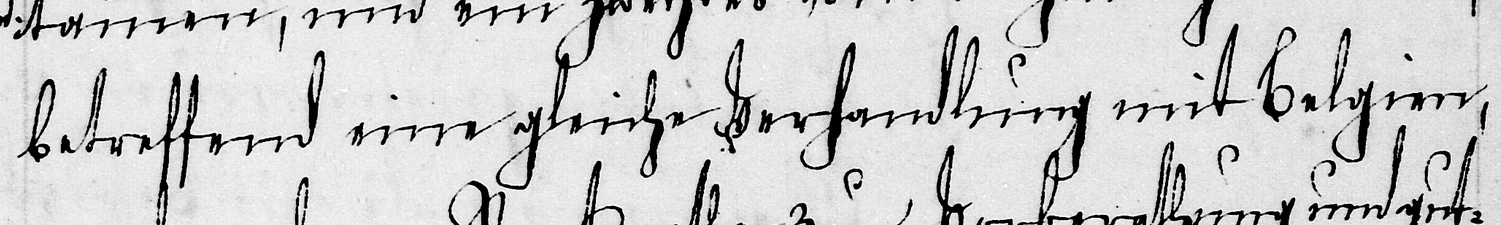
betreffend eine gleiche Verhandlung mit Belgien,
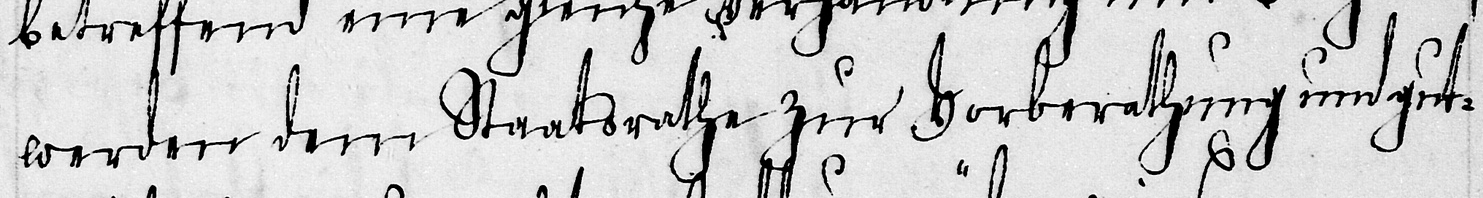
werden dem Staatsrathe zur Vorberathung und gut¬
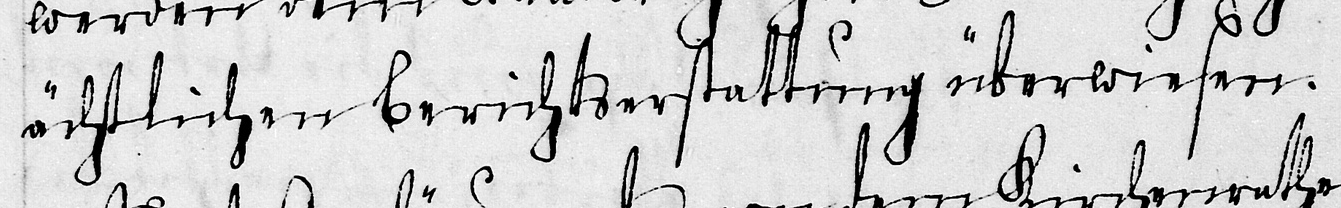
ächtlichen Berichtserstattung überwiesen.
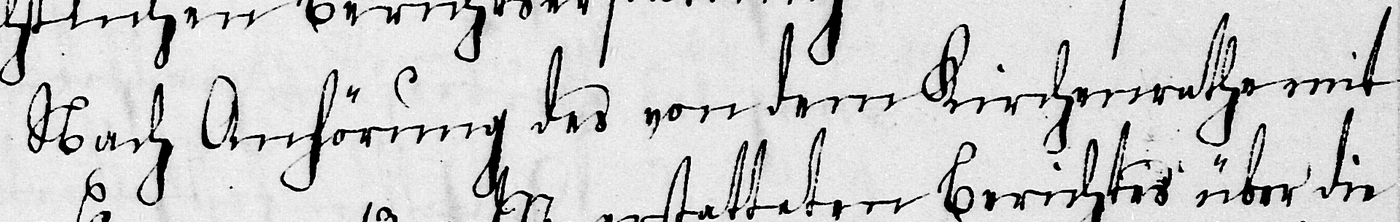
Nach Anhörung des von dem Kirchenrathe mit
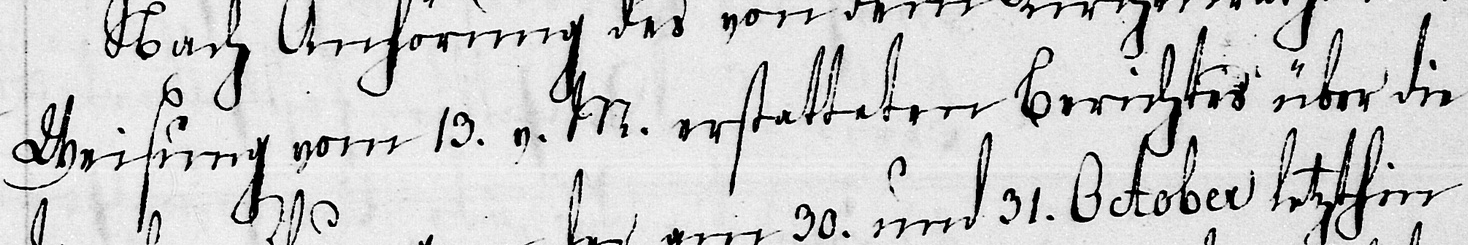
Weisung vom 13. v. M. erstatteten Berichtes über die
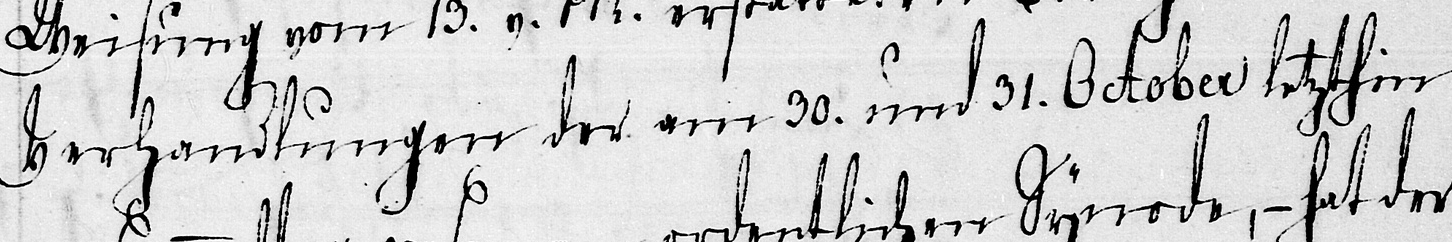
Verhandlungen der am 30. und 31. October letzthin
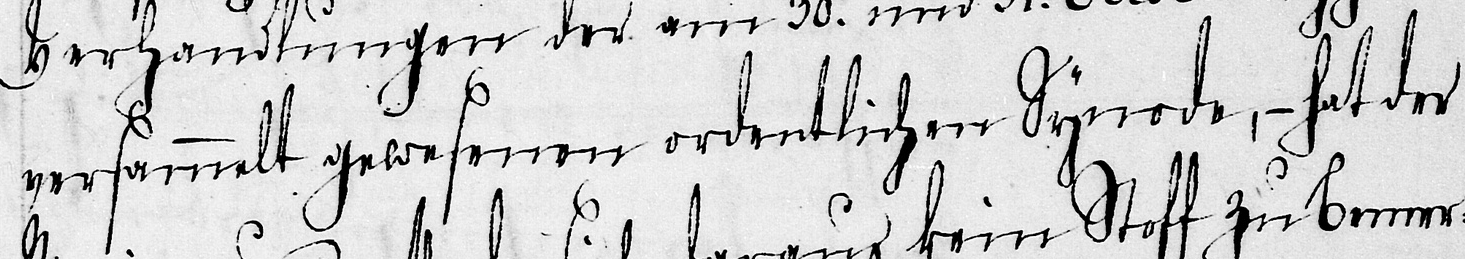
versammelt gewesenen ordentlichen Synode, – hat der
